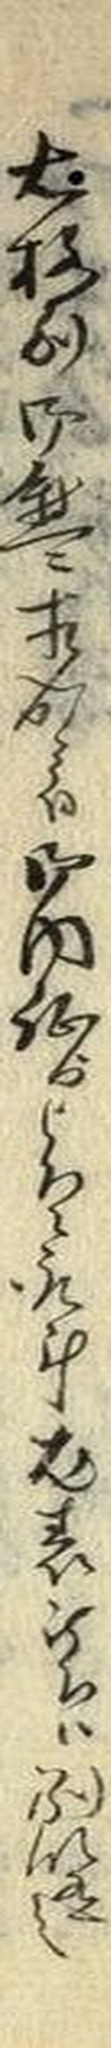右格別御慰ニ相成候ニ付御内証ゟ被下ニ取計尤表被下ハ別段有之
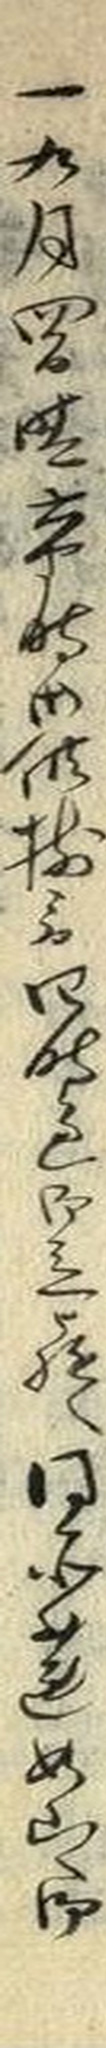一九月四日晴六半時御供揃ニ而四時過御立被遊候同所蓮如山へ御
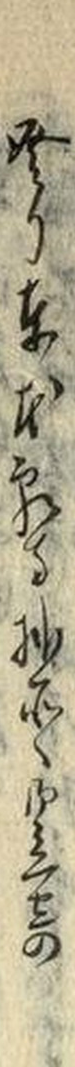登り東本願寺掛所へ御立寄
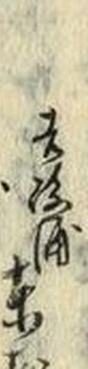吉崎浦
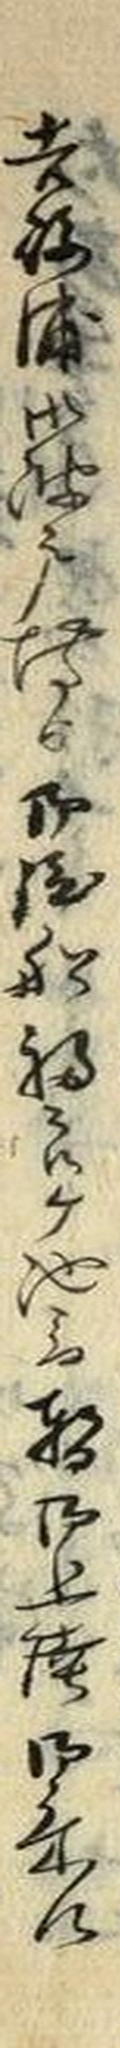吉崎浦御波戸場ゟ御渡船福良ケ池ニ而暫御上陸御床几
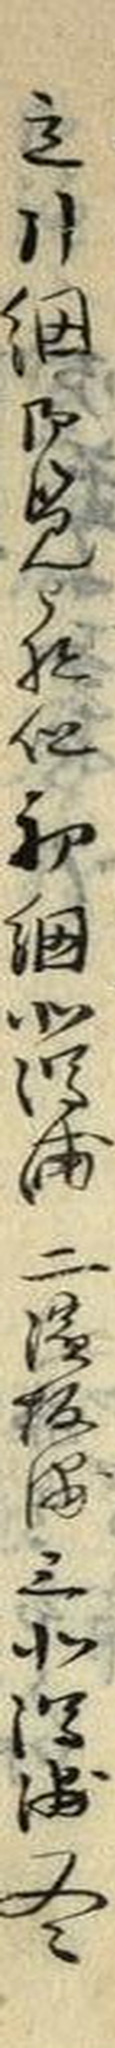立引網御覧被遊但初網北潟浦二浜坂浦三北潟浦又々
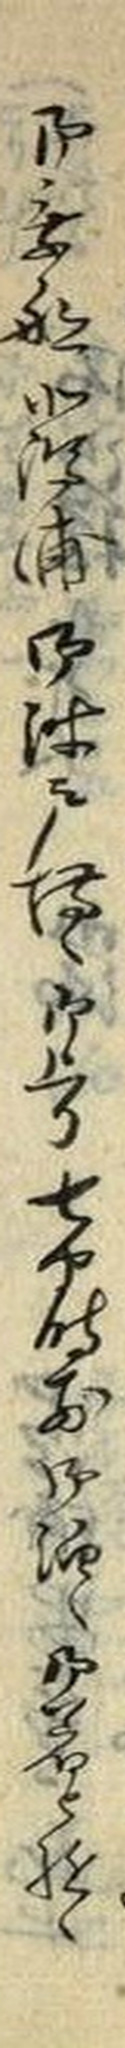御乗船北潟浦御波戸場へ御上り七半時前御泊へ御着被遊候

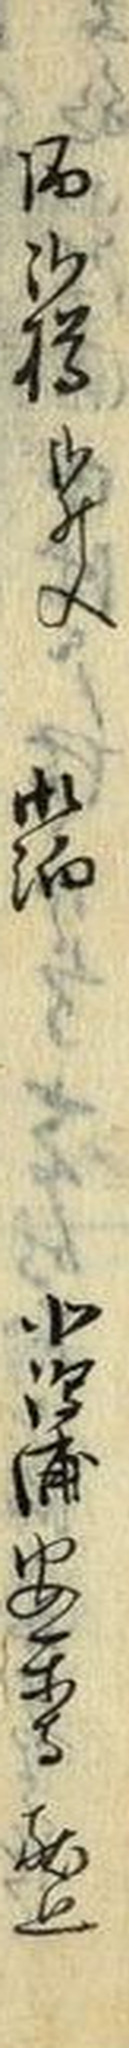酒弐樽弐升入御泊北潟浦安楽寺献上
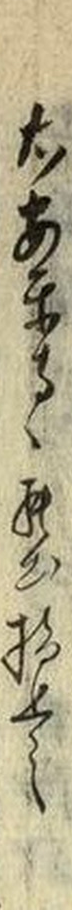右安楽寺へ罷出指上之
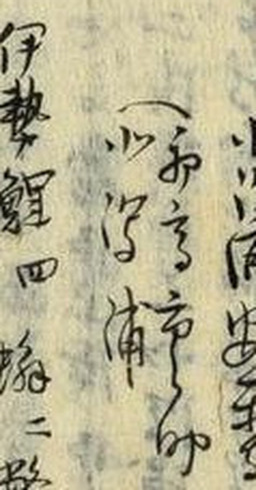北潟浦
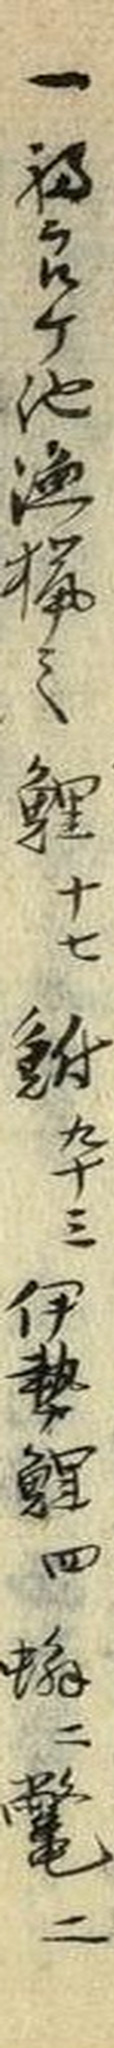一福良ケ池漁猟之鯉十七鮒九十三伊勢鯉四蟹二鼈二
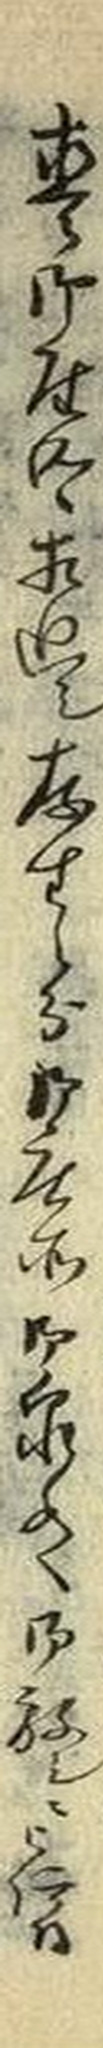直ニ御座所へ相廻シ存生之分御座所御泉水へ御放シニ被仰付
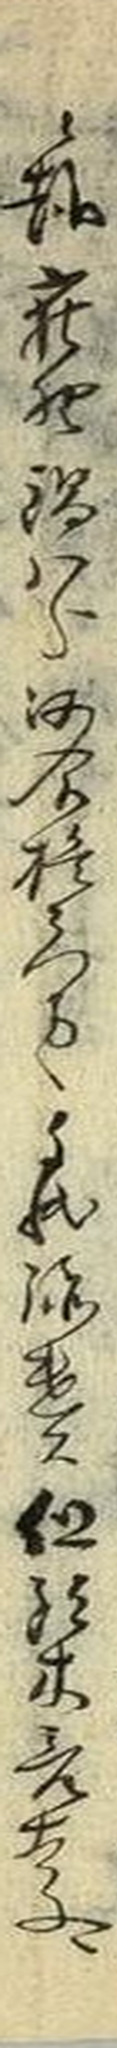候趣荻野鍋八郎河合権右衛門方へ手紙添遣ス但鈴木彦太夫へ
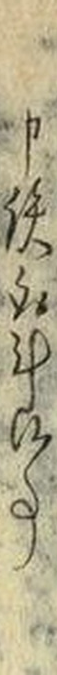申談取計候事
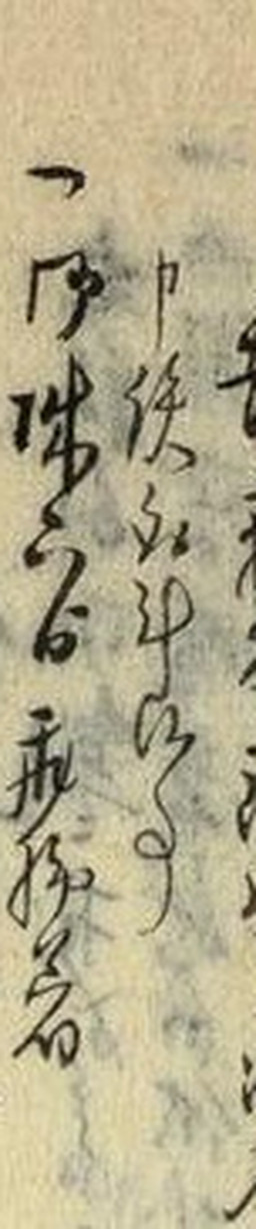一御城下ゟ飛脚着
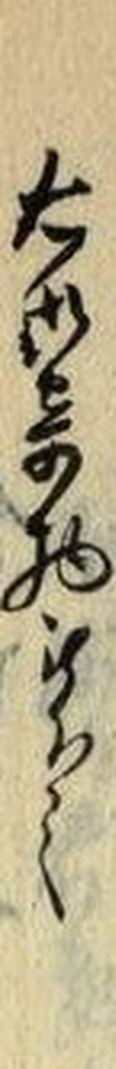右御寄物被下之
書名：少傅日録抄（斉承付側向頭取日記、在国）
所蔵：福井県文書館 Fukui Prefectural Archives
